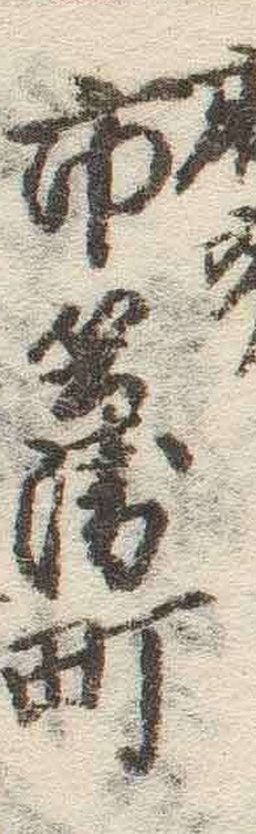市兵衛町
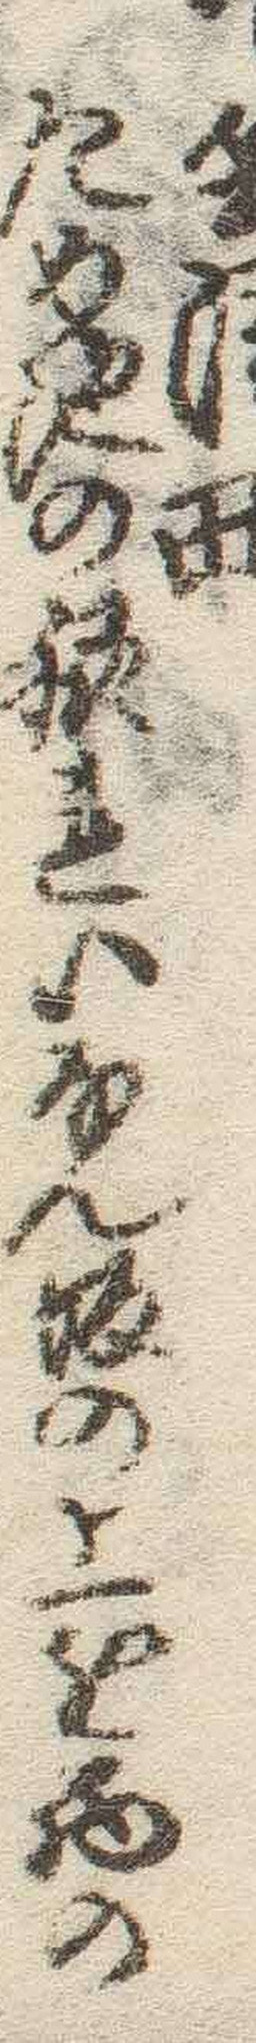ため池の脇れはなん坂の上を西の
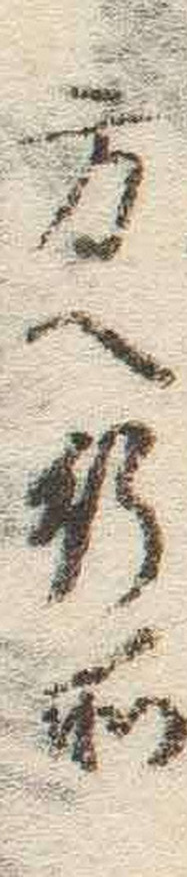方へ行所
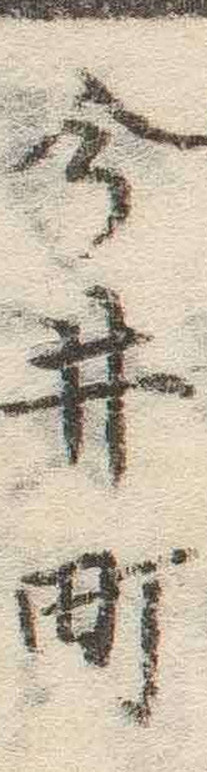今井町
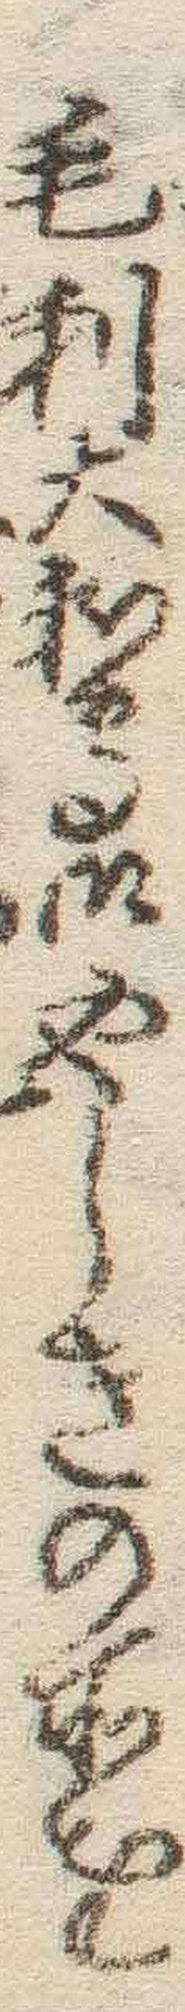毛利大和守御やしきの所を
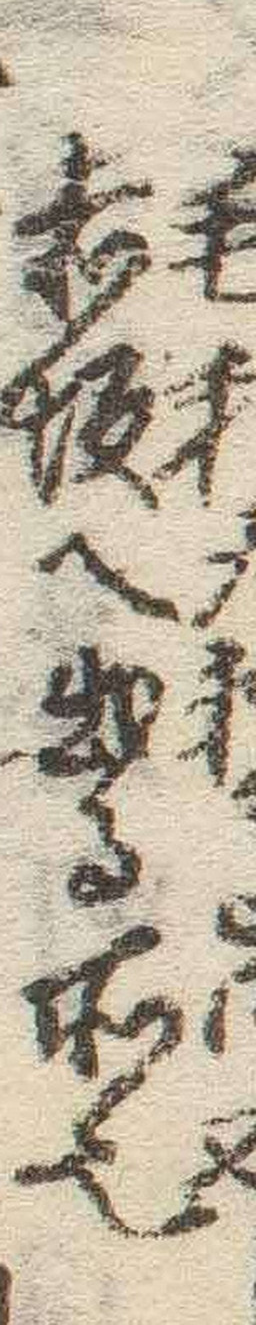赤坂へ出る所也
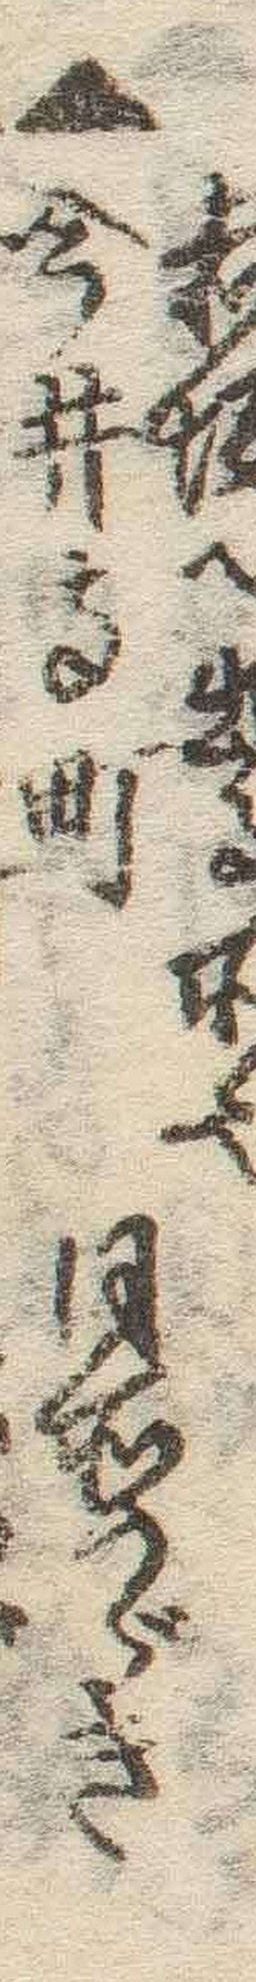▲今井高町同所つゞき
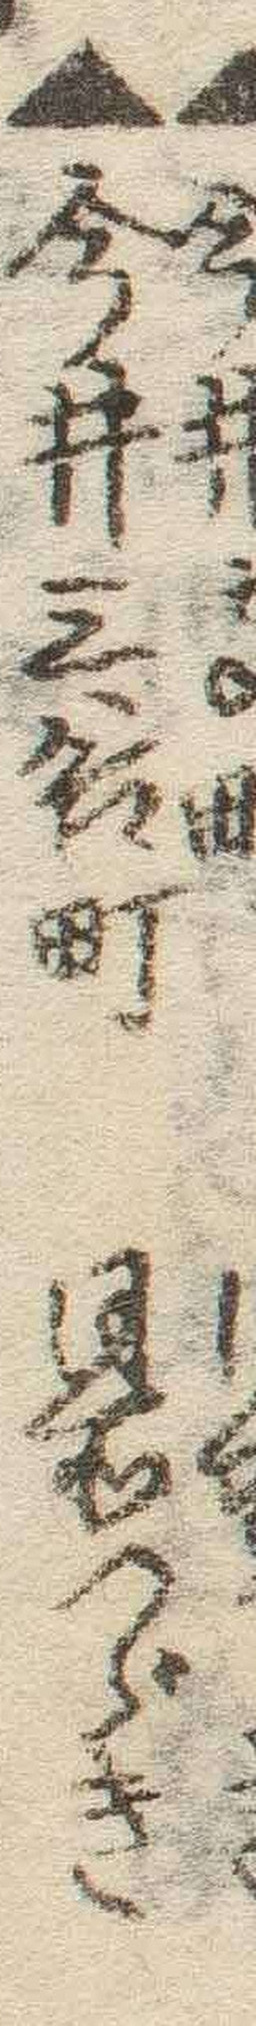▲今井三谷町同所つゞき
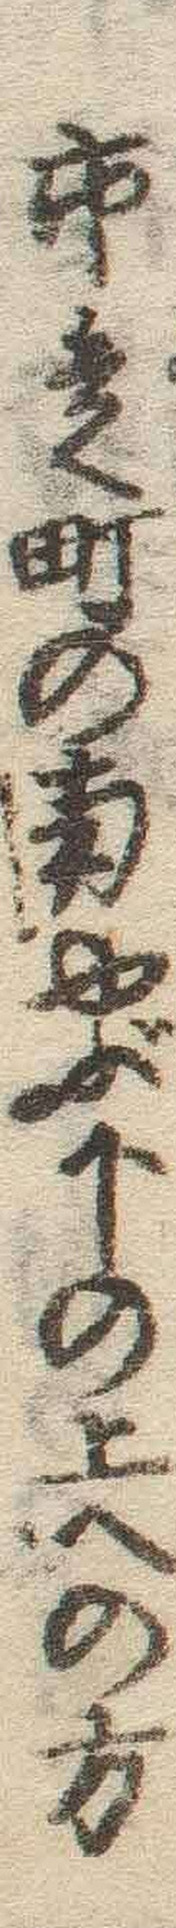市色町の南やぶ下の上への方

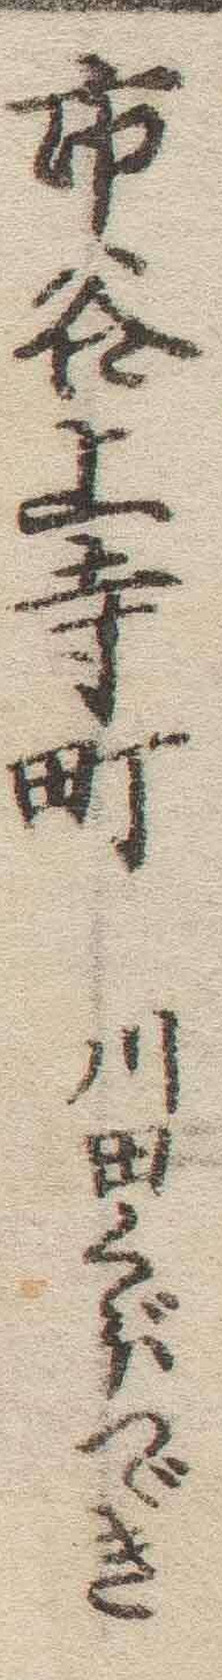市谷上寺町川田くぼつゞき
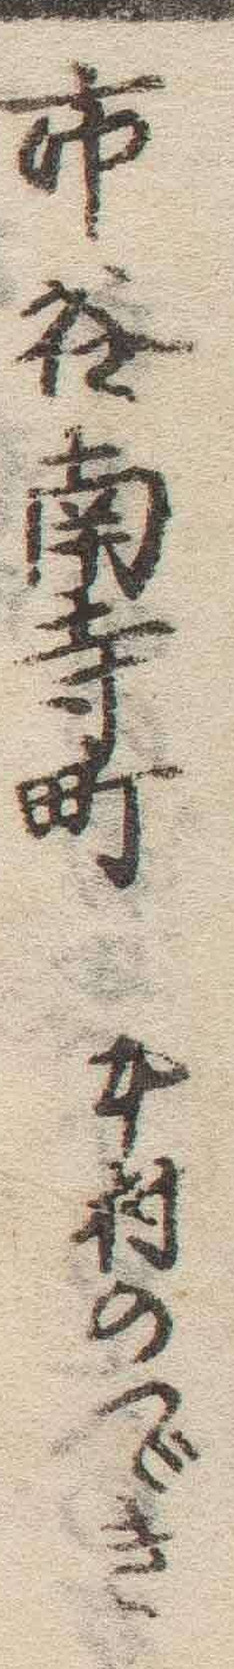市谷南寺町本村のつゞき
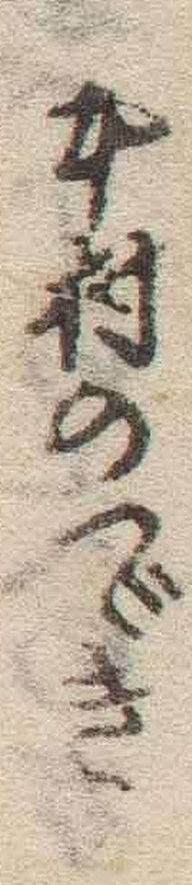茅町のつゞき
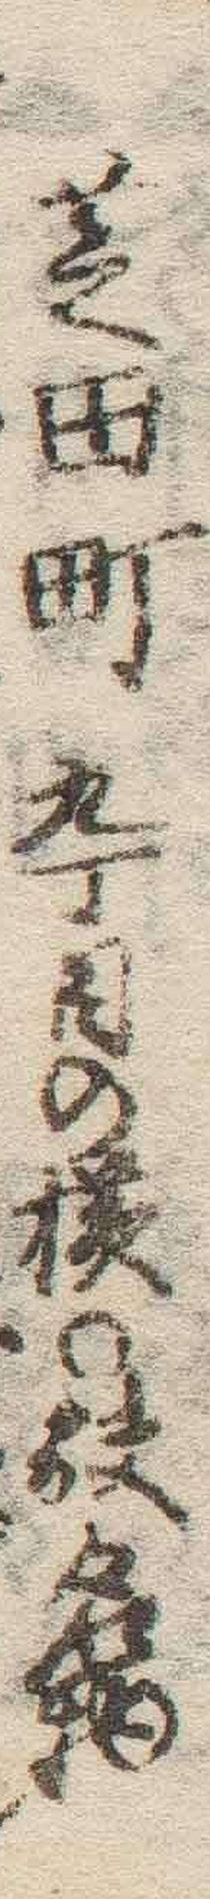芝田町九丁目の横○麸名物
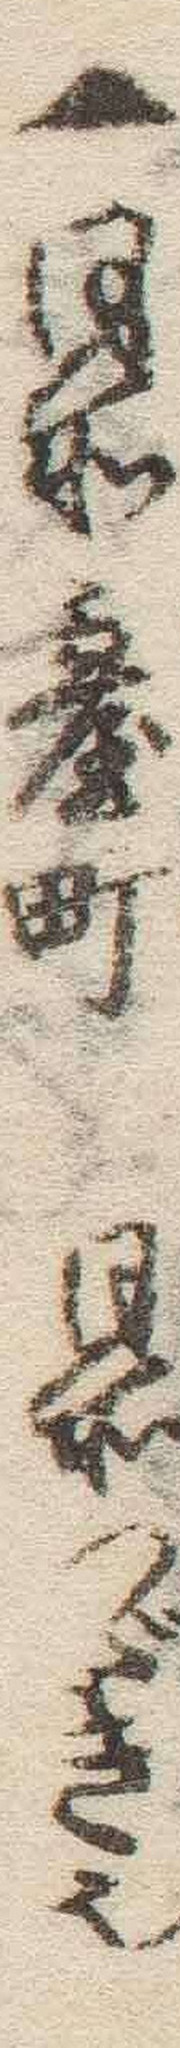▲同所台町同所つゞき也
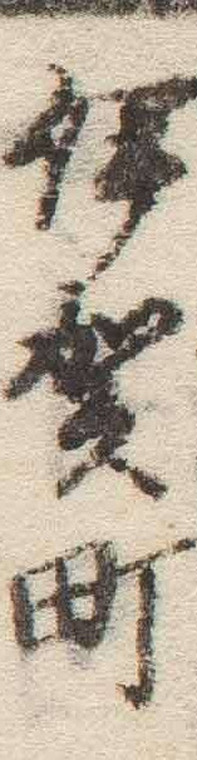伊賀町
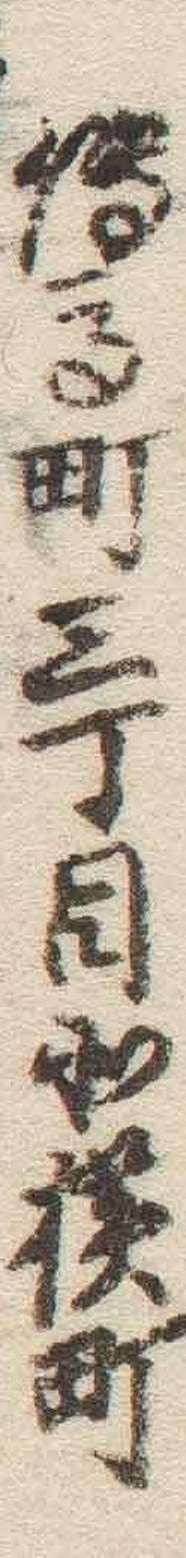伝馬町三丁目北横町
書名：江戸町独案内
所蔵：東京学芸大学附属図書館 国文学研究資料館
